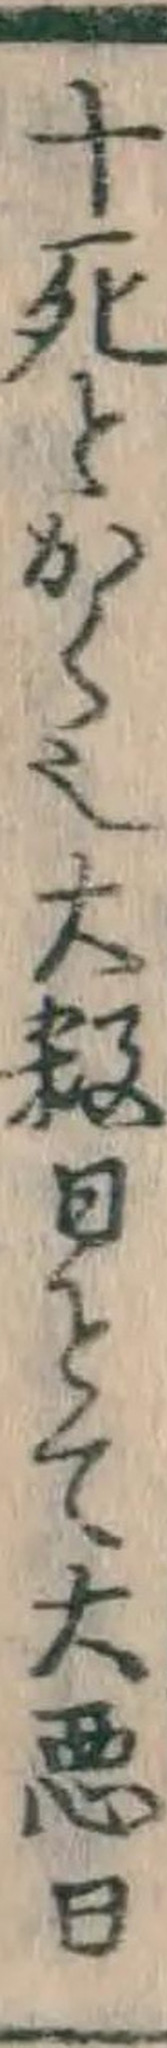十死とかく也大殺日とて大悪日
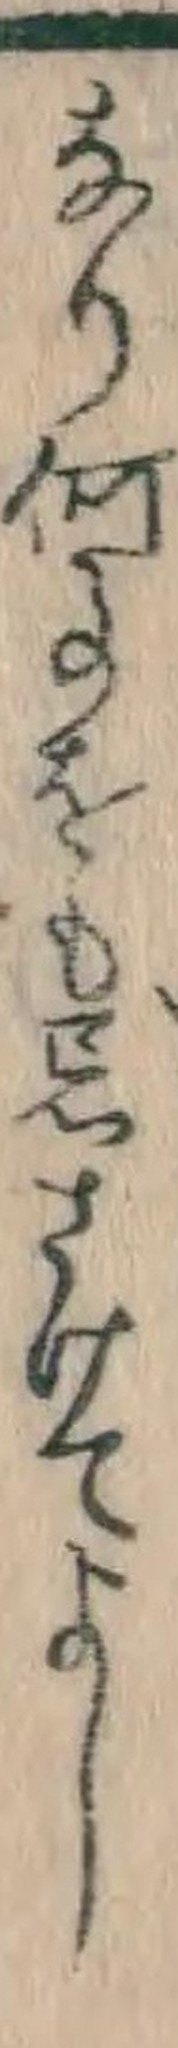なり何事をも忌さけてよし

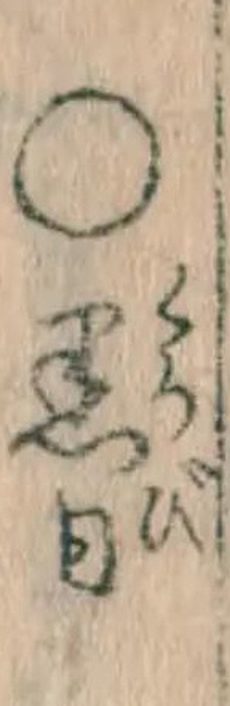○黒日
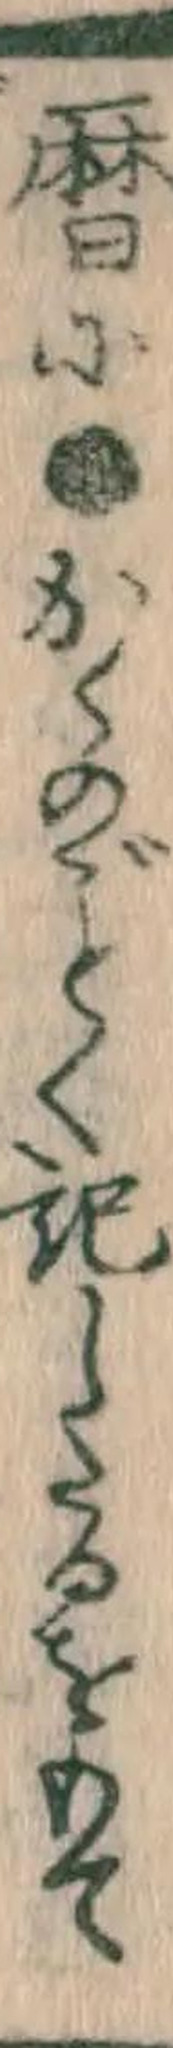暦に●かくのごとく記したるをもて
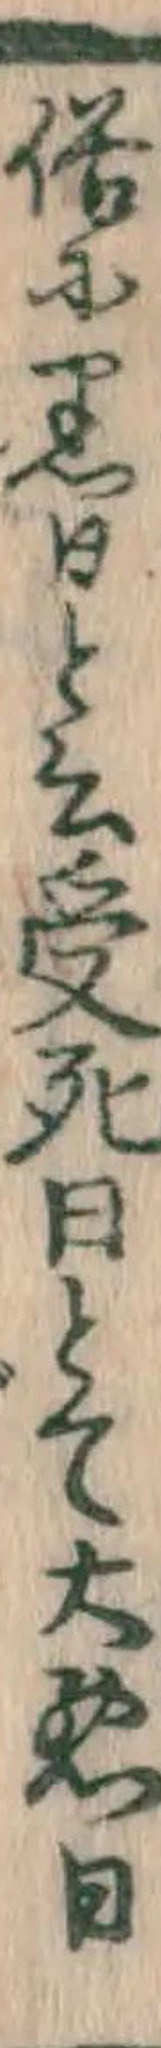俗に黒日と言受死日とて大悪日
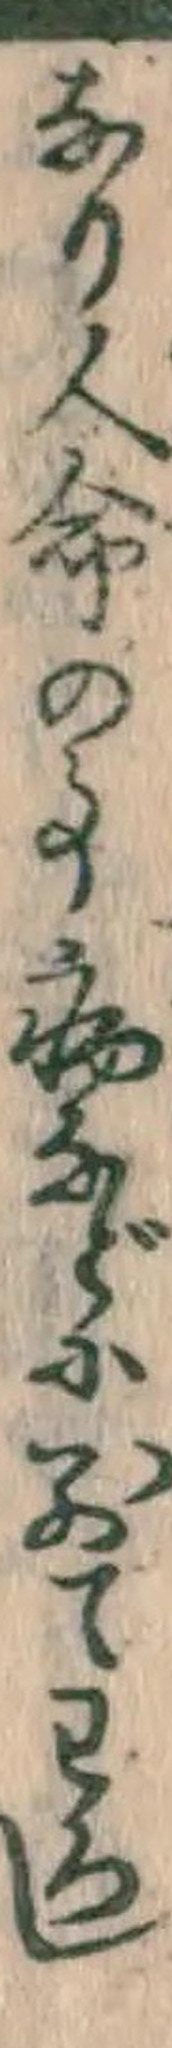なり人命の事病などに別てわろし
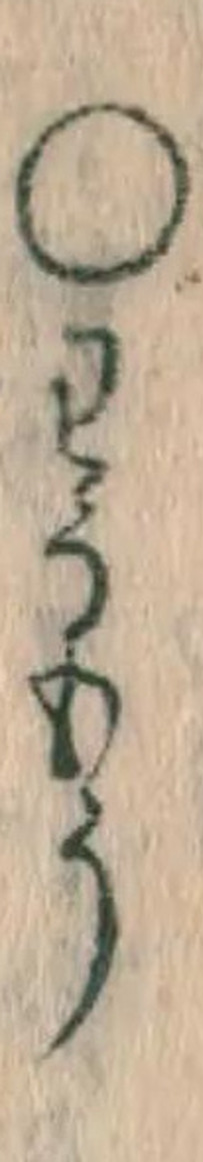○わうもう
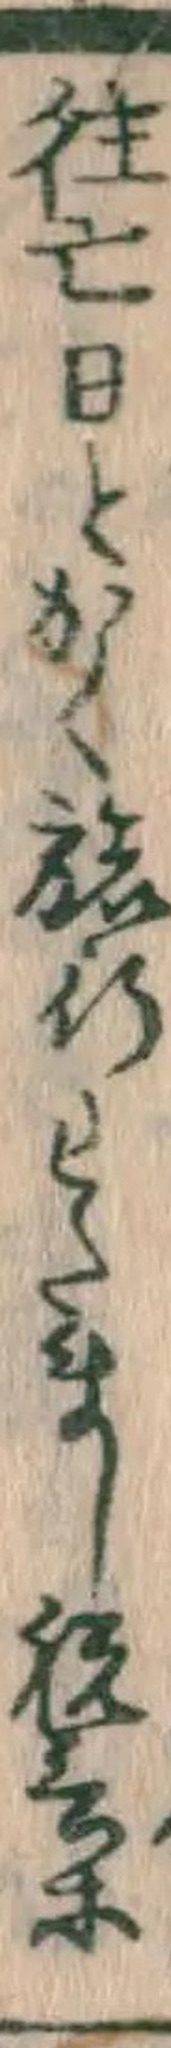往亡日とかく旅行わたまし祝言等
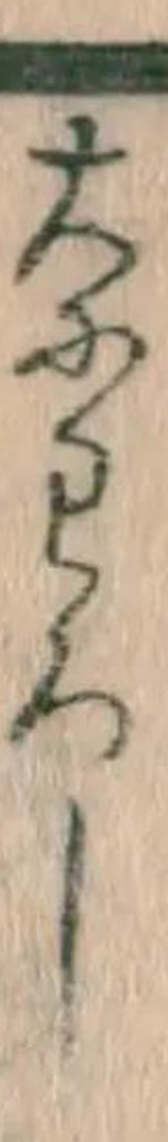大にわろし
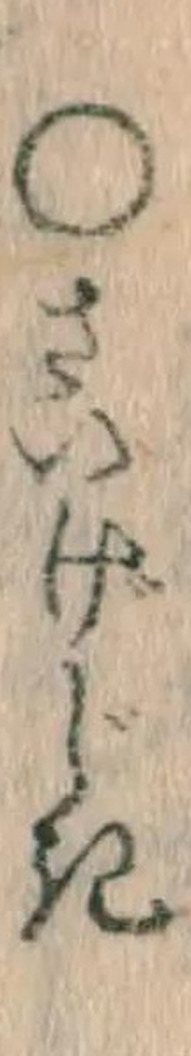○さいげじき
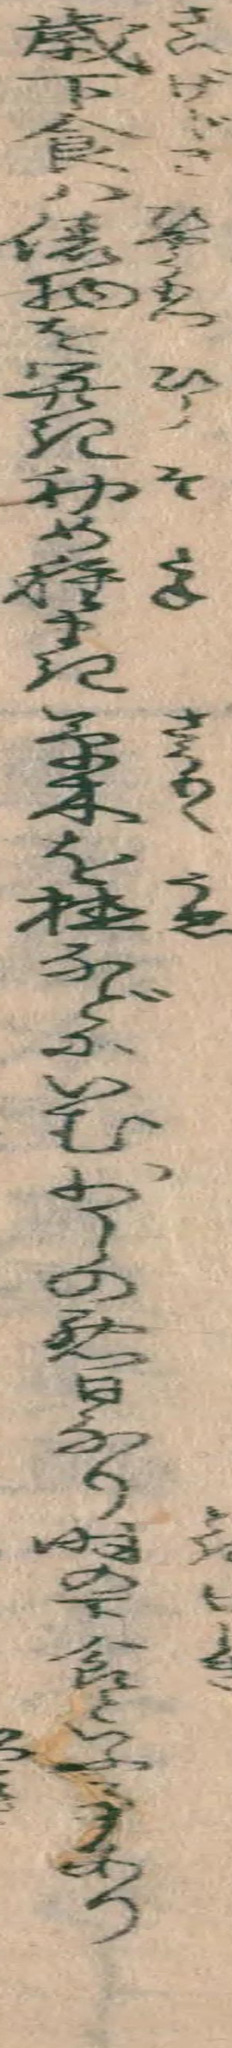歳下食は俵物を開き初め種まき草木を植などにいむ少しの悪日なり時の下食といふ事あり
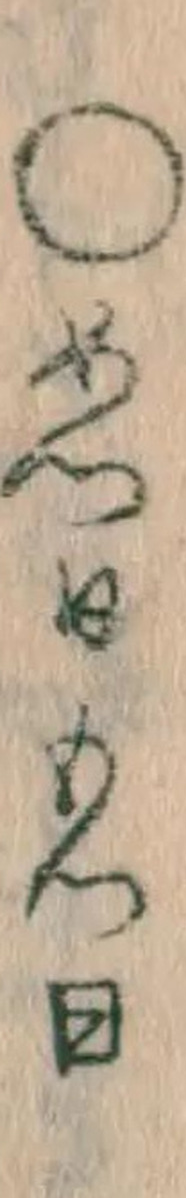○めつ日もつ日
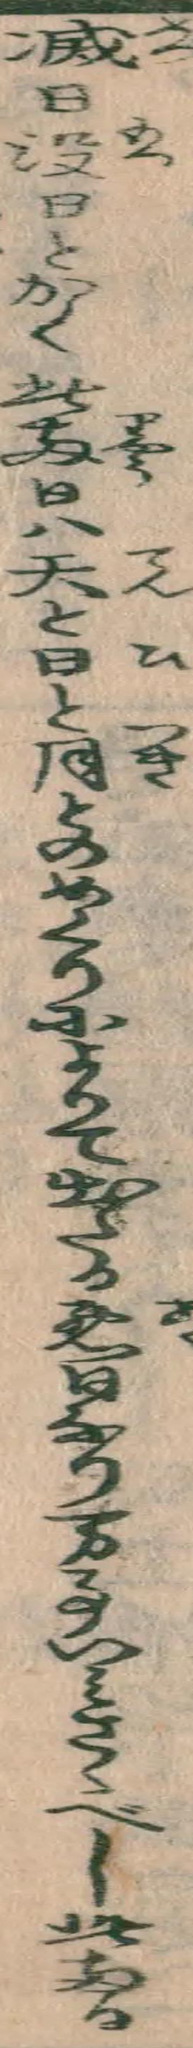滅日没日とかく此両日は天と日と月とのめくりによりて出たる悪日なり万事いみさくべし此両日
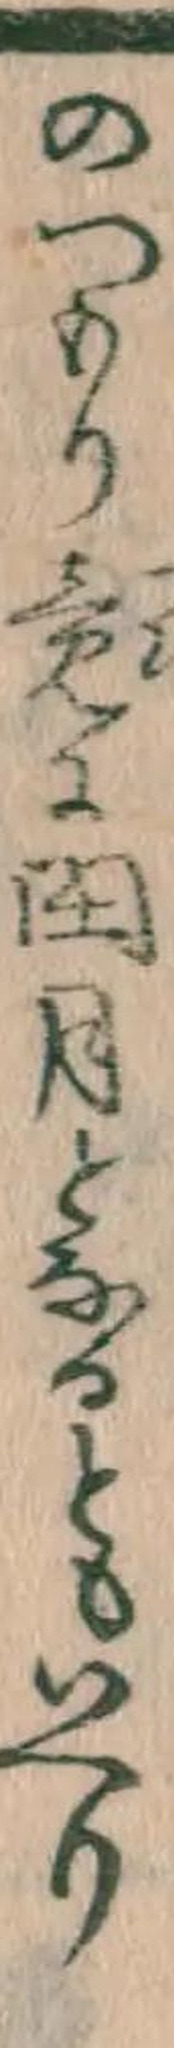のつもり竟に閏月となるともいへり
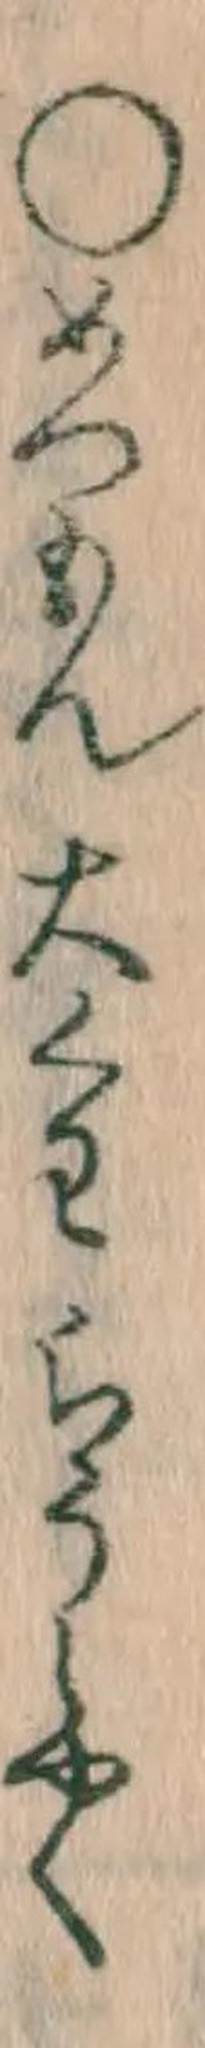○めつもん大くわらうしやく
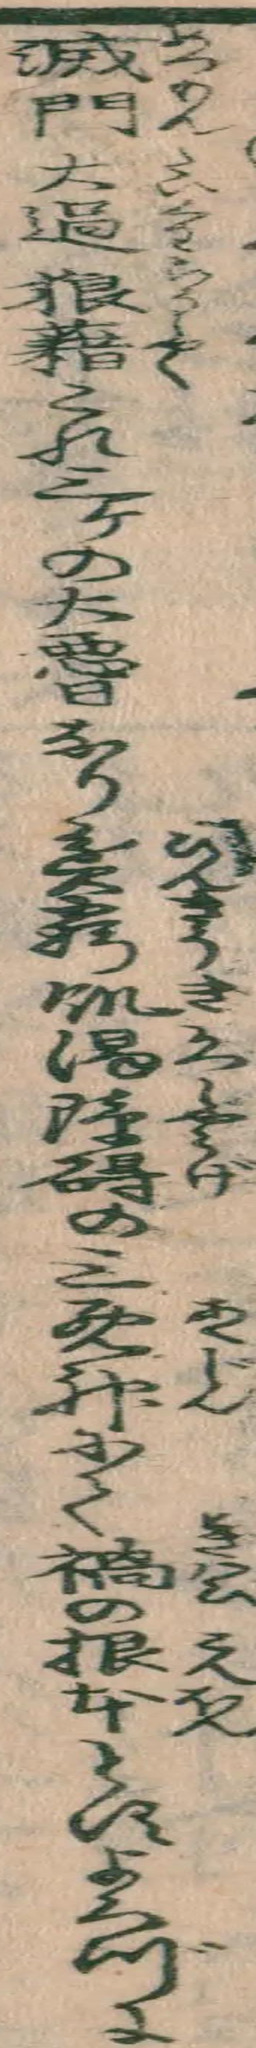滅門大過狼藉これ三ヶの大悪日なり貧窮飢渇障碍の三悪神にて禍の根本とすよろづに
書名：広益秘事大全 3巻. [4]
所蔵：国立国会図書館 National Diet Library, JAPAN
